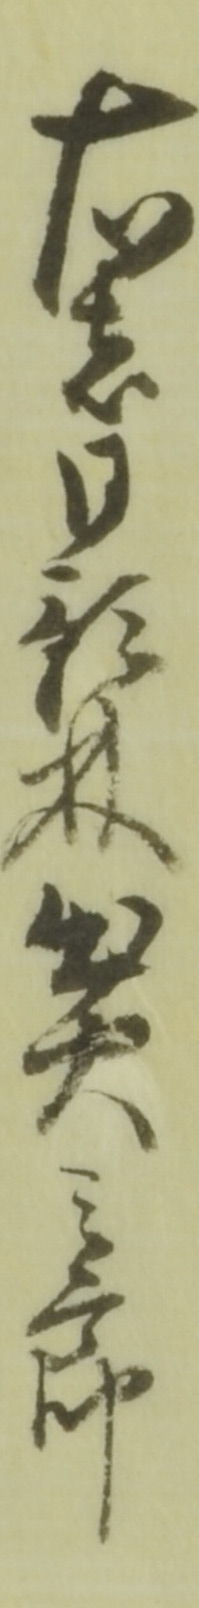右者日影林出火之節
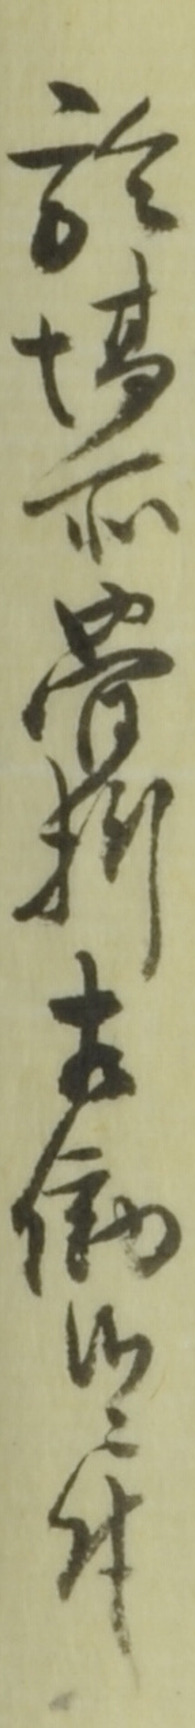於場所骨折相働候ニ付

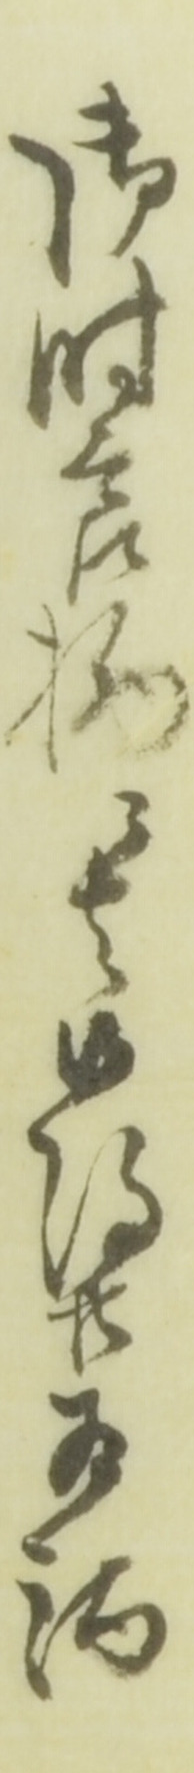御時節柄ニ者候得共為酒
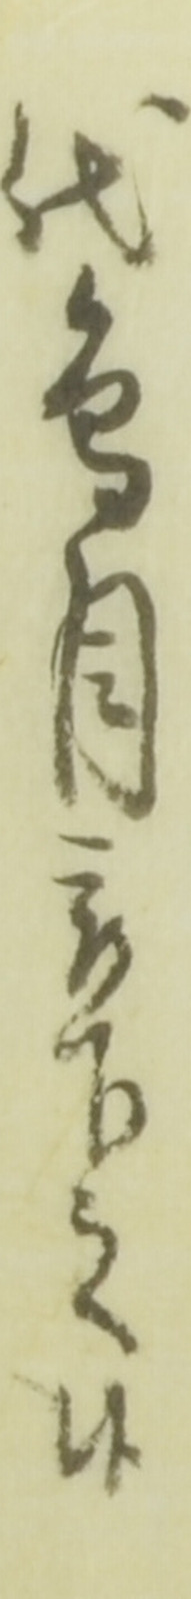代鳥目被下之候
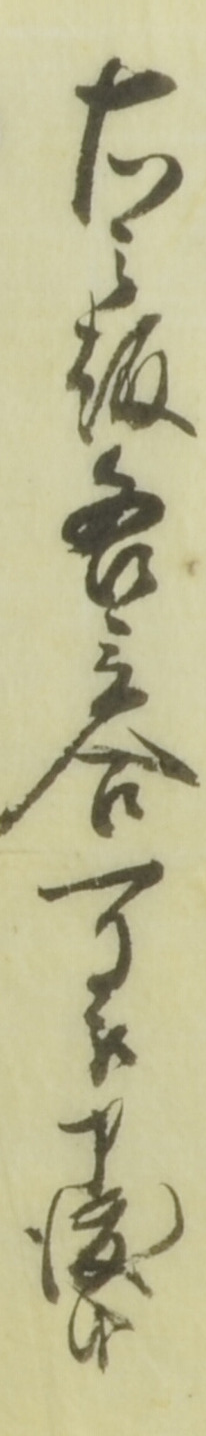右之趣各立合可被申渡候
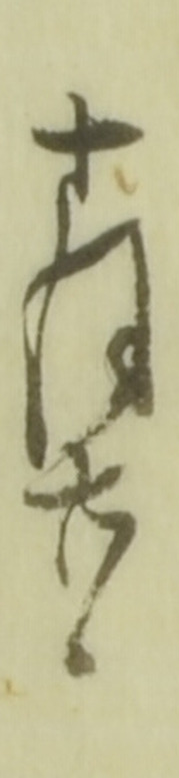十月廿日
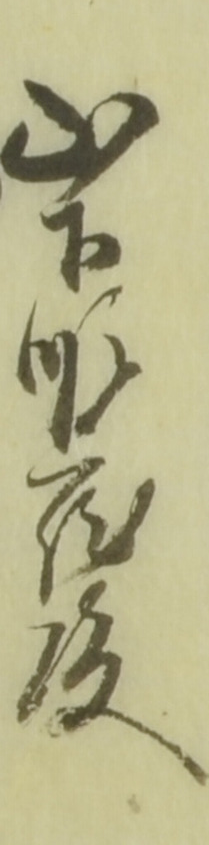山下順蔵殿
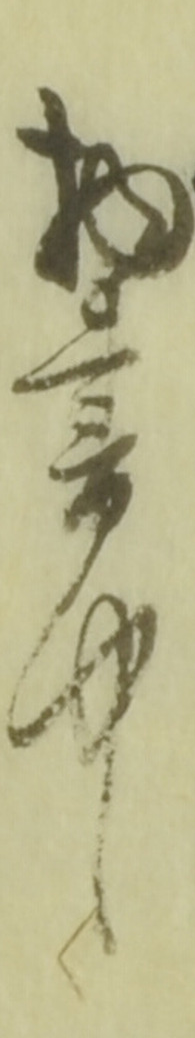物書中
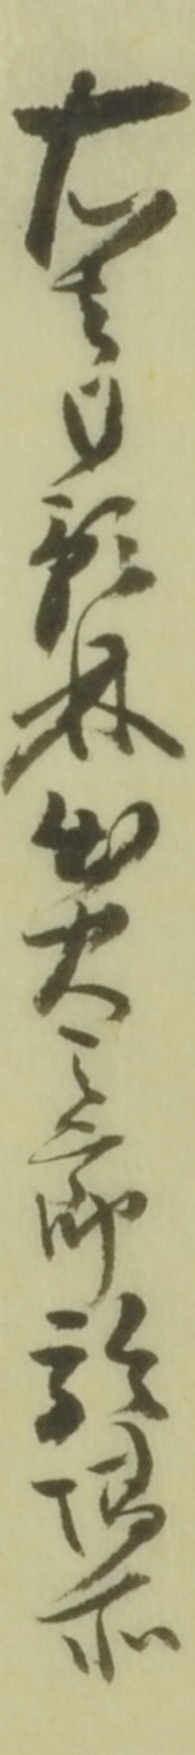右者日影林出火之節於場所
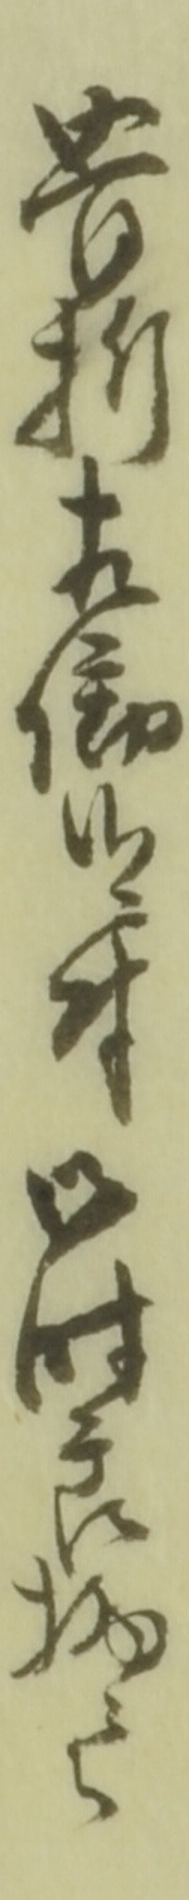骨折相働候ニ付御時節柄ニ者
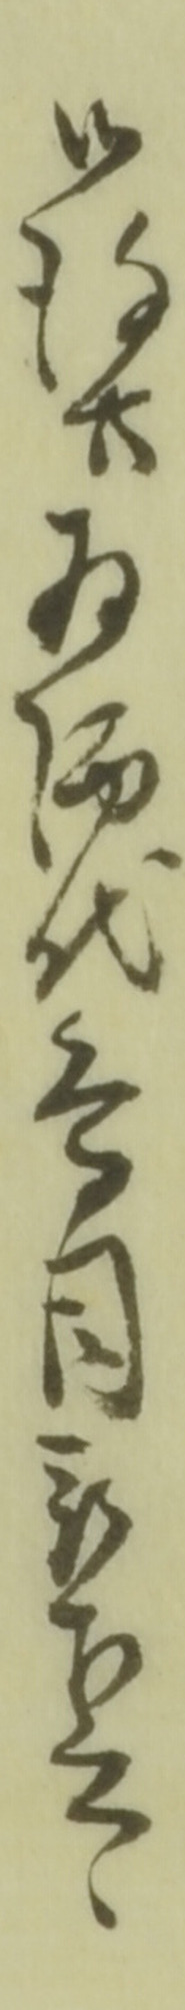候得共為酒代鳥目被下之候
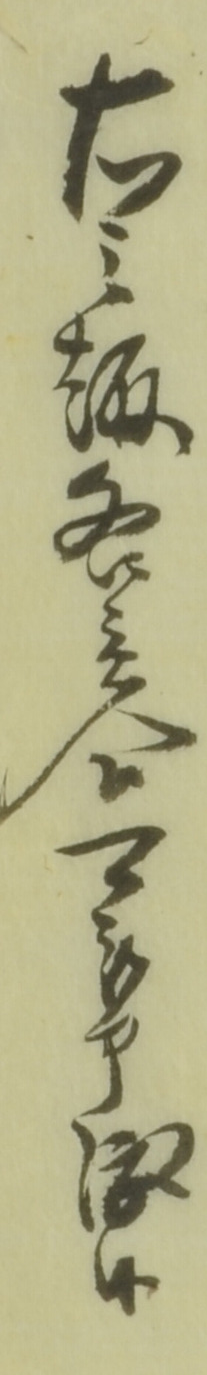右之趣各立合可被申渡候
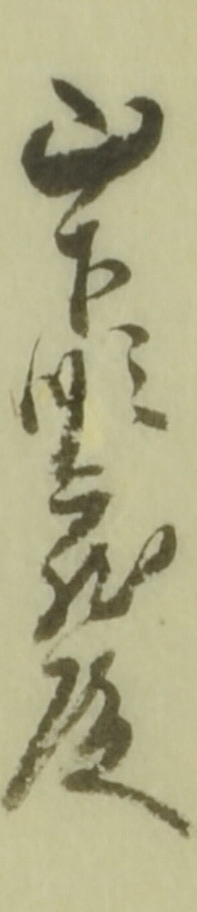山下順蔵殿
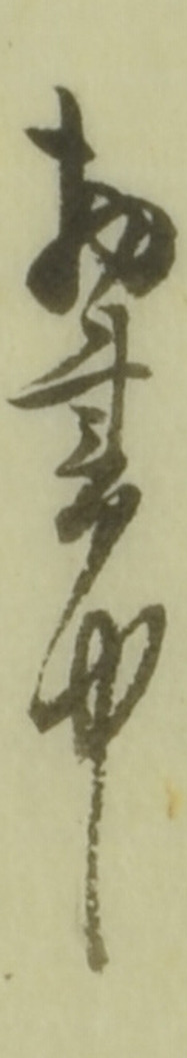物書中
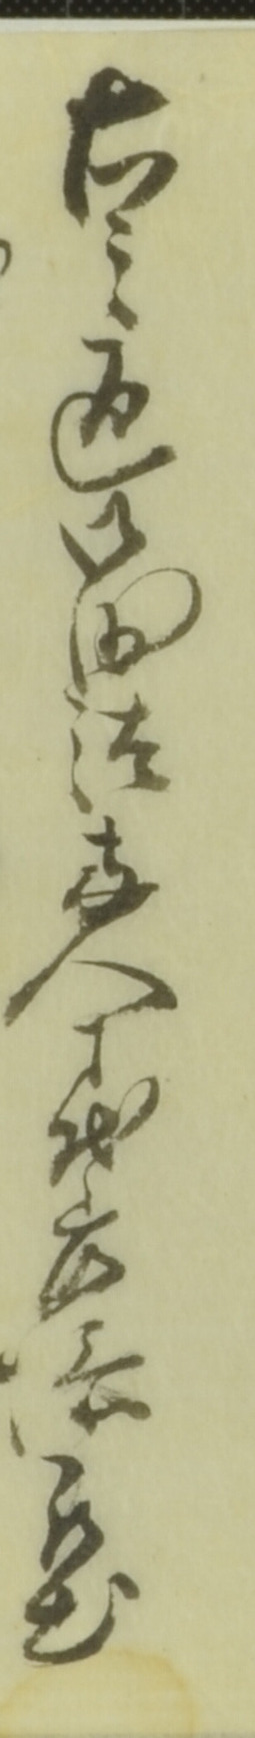右之通御沙汰両人丁代差添罷出
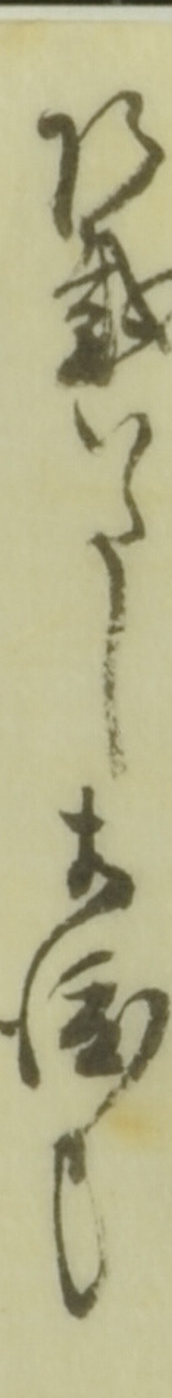頂戴いたし相渡申候
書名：御触書御書附控
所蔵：伊那市立高遠町図書館・合同会社AMANE
